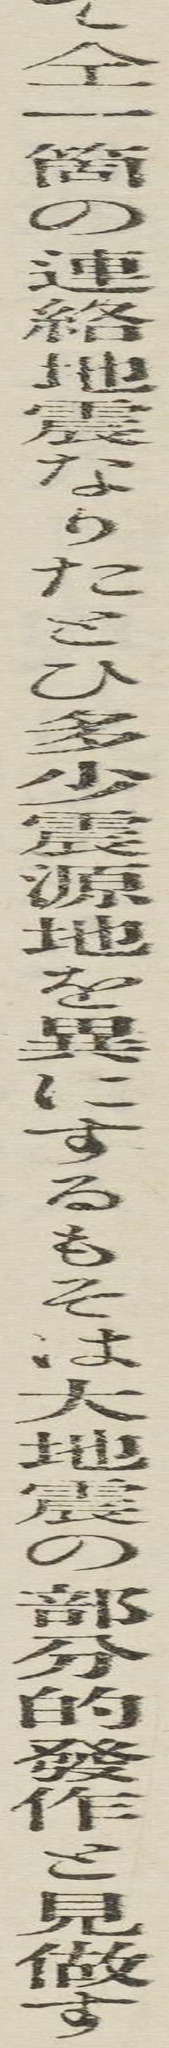て同一箇の連絡地震なりたとひ多少震源地を異にするもそは大地震の部分的発作と見做す
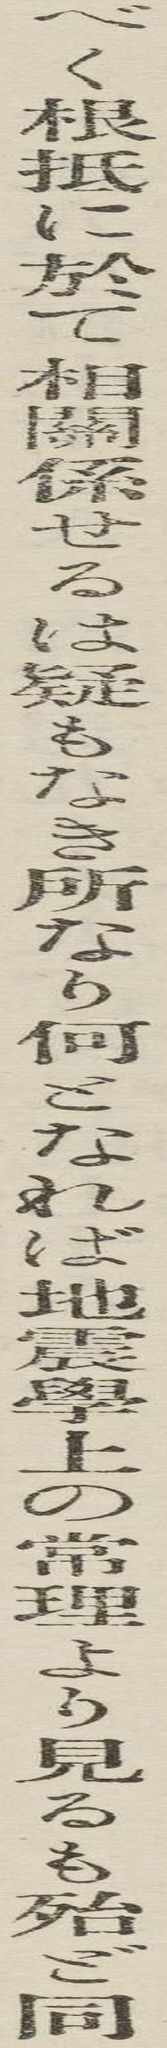べく根底に於て相関係せるは疑もなき所なり何となれば地震学上の常理より見るも殆ど同
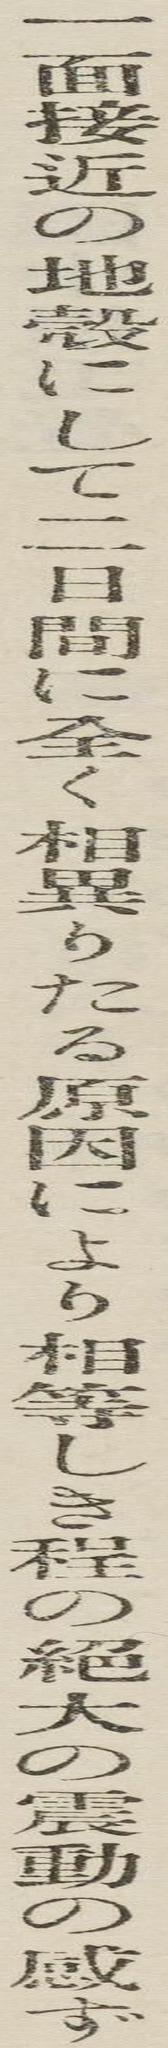一面接近の地殻にして二日間に全く相異りたる原因により相等しき程の絶大の震動の感ず
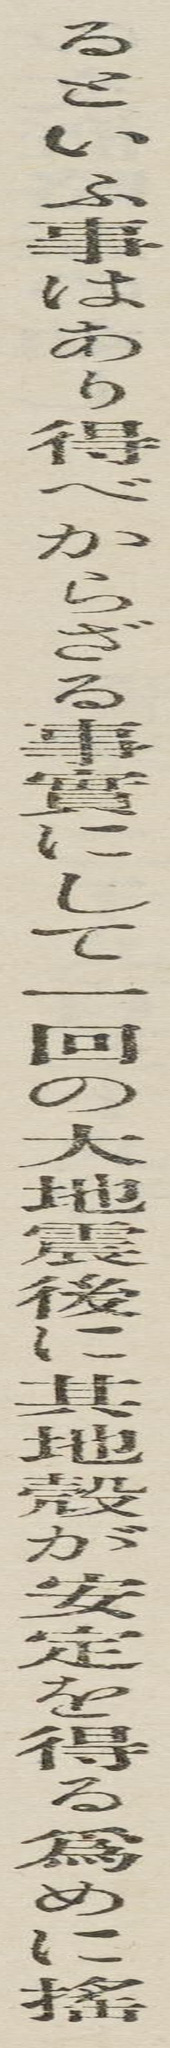るといふ事はあり得べからざる事実にして一回の大地震後に其地殻が安定を得る為めに揺
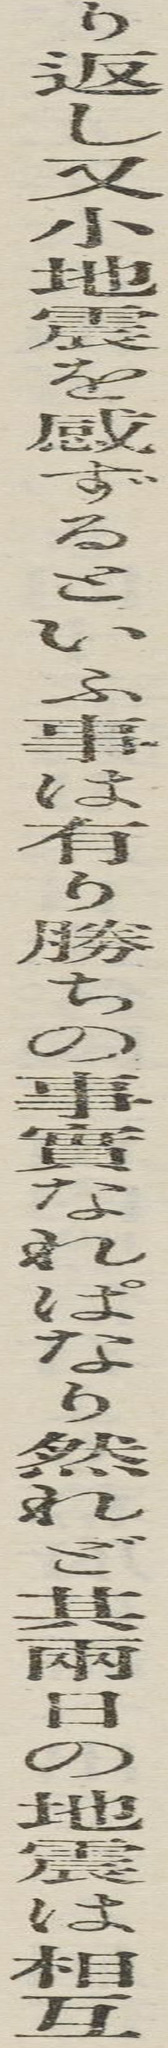り返し又小地震を感ずるといふ事は有り勝ちの事実なればなり然れど其両日の地震ハ相互
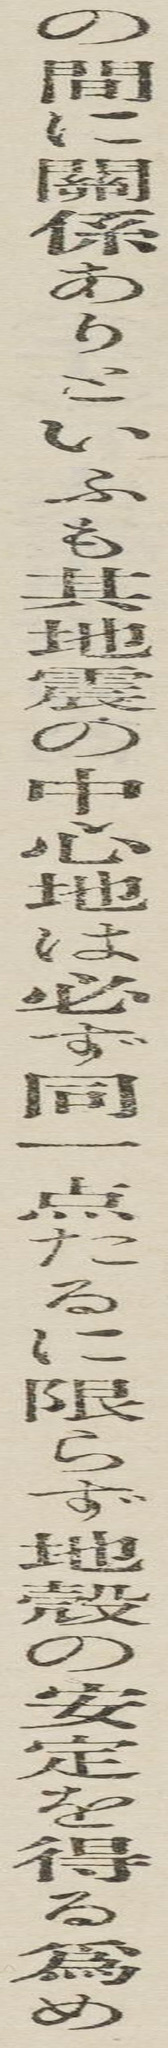の間に関係ありといふも其地震の中心地は必ず同一点たるに限らず地殻の安定を得る為め
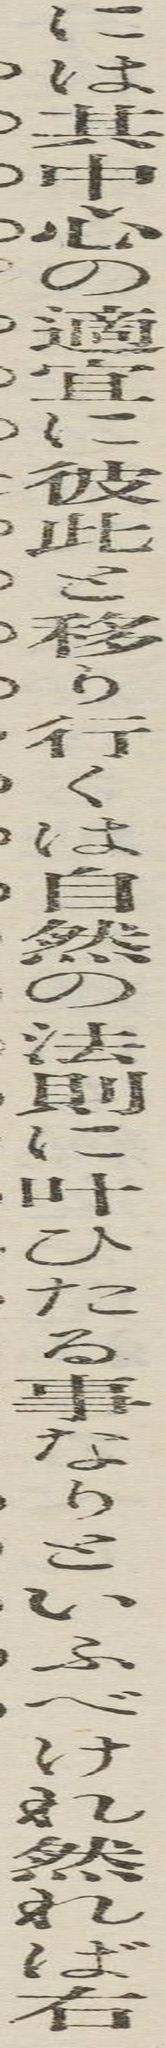には其中心の適宜に彼此と移り行くは自然の法則に叶ひたる事なりといふべけれ然れば右
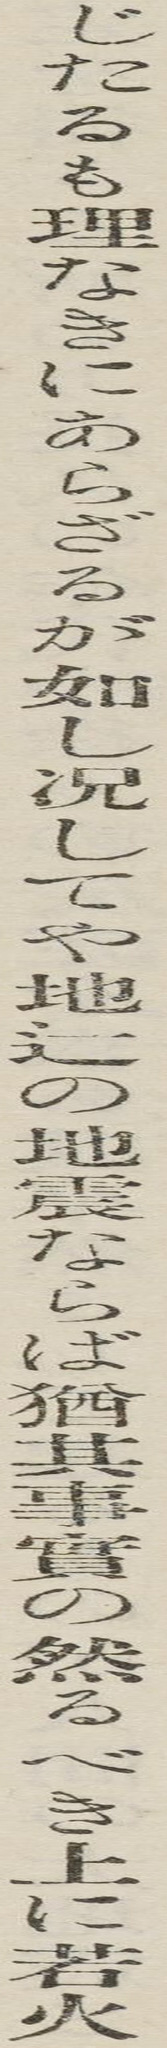じたるも理なきにあらざるが如し況してや地辷の地震ならば猶其事実の然るべき上に若火
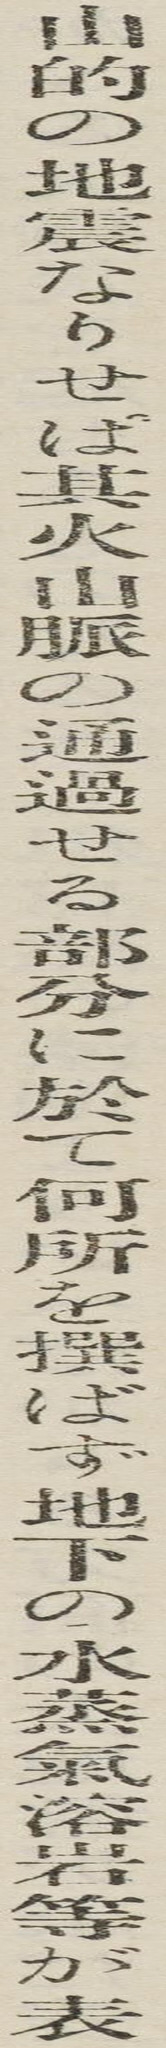山的の地震なりせば其火山脈の通過せる部分に於て何所を選ばず地下の水蒸気溶岩等が表
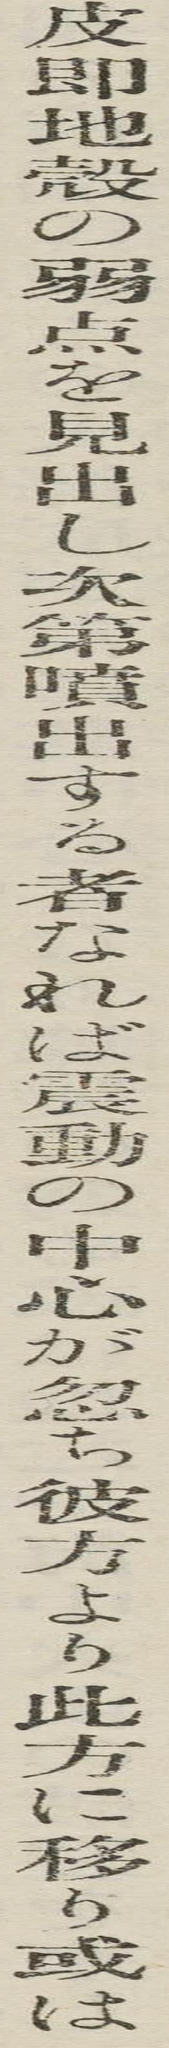皮即地殻の弱点を見出し次第噴出する者なれば震動の中心が忽ち彼方より此方に移り或は
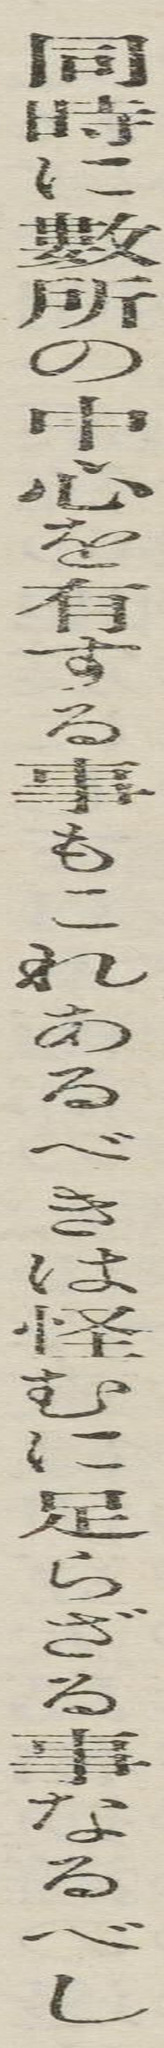同時に數所の中心を有する事もこれあるべきは怪むに足らざる事なるべし
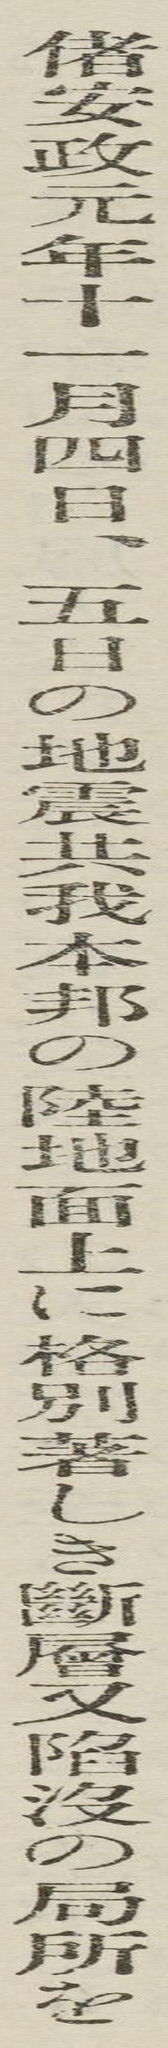扨安政元年十一月四日、五日の地震共我本邦の陸地面上に格別著しき断層又陥没の局所を
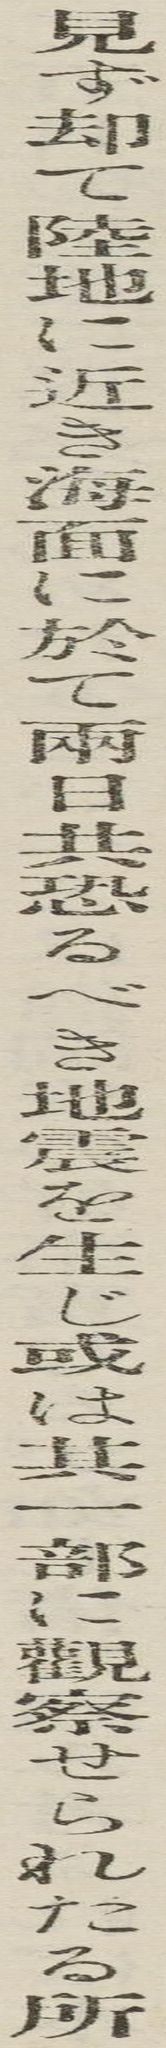見ず却て陸地に近き海面に於て両日共恐るべき地震を生じ或は其一部に観察せられたる所
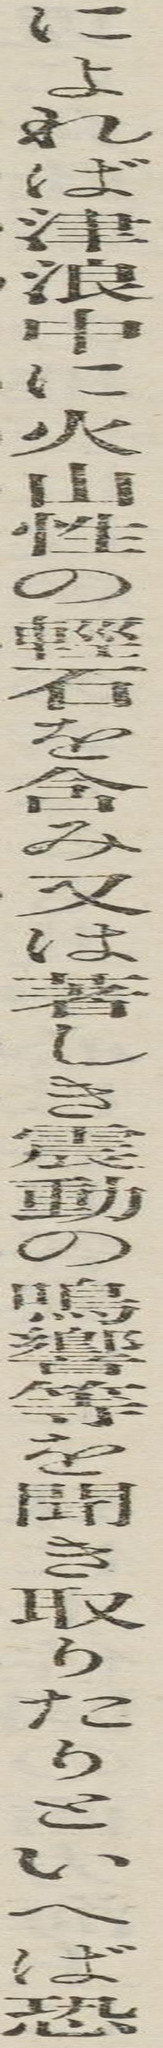によれば津浪中に火山性の軽石を含み又は著しき震動の鳴響等を聞き取りたりといへば恐

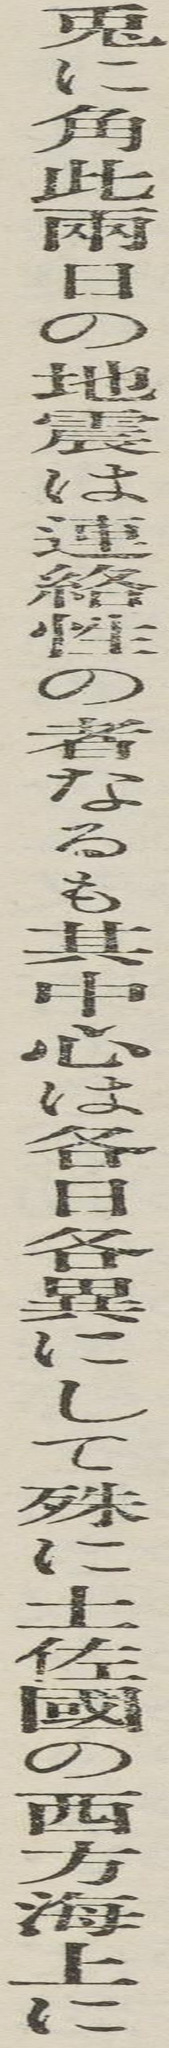兎に角此両日の地震は連絡性の者なるも其中心は各日各異にして殊に土佐国の西方海上に
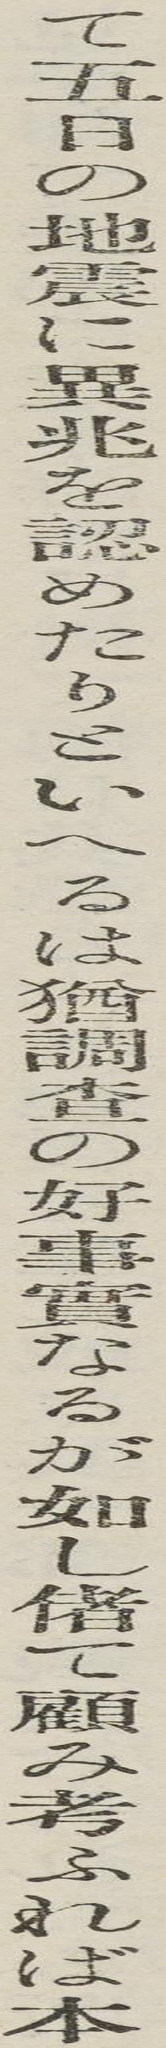て五日の地震に異兆を認めたりといへるは猶調査の好事実なるが如し偖て顧み考ふれば本
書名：土佐古今ノ地震
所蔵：東京大学地震研究所図書室 Earthquake Research Institute Library, The University of Tokyo, JAPAN
